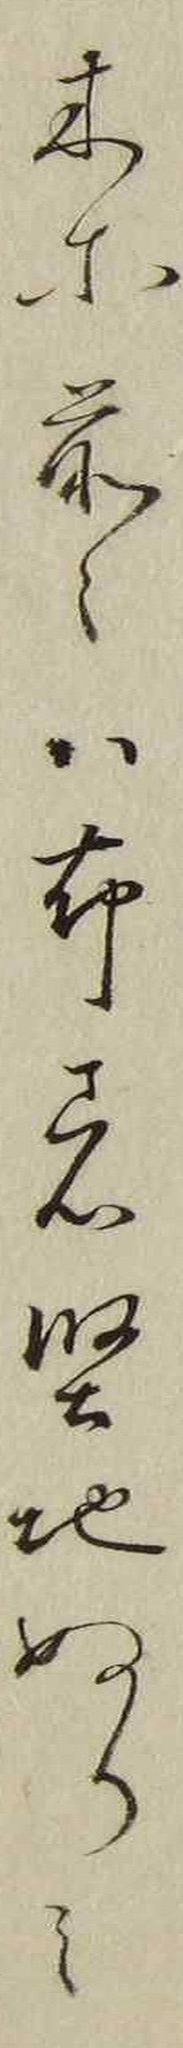木等前々ハ布着堅地ぬり之

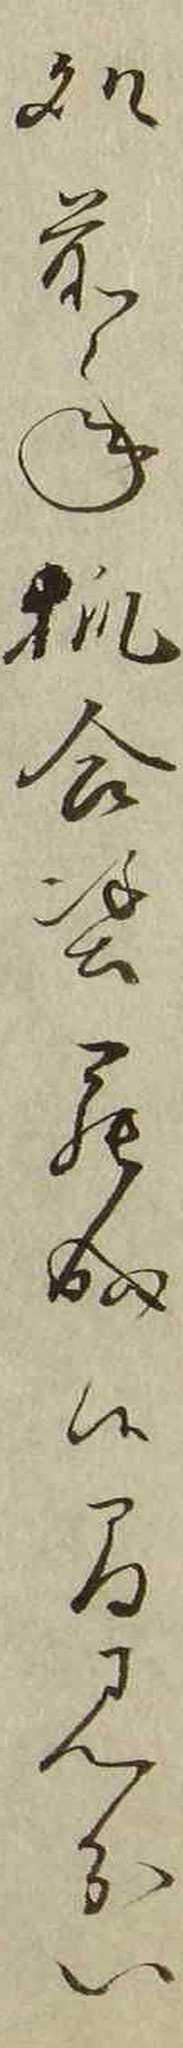処前年狐合壁罷成候間見分い
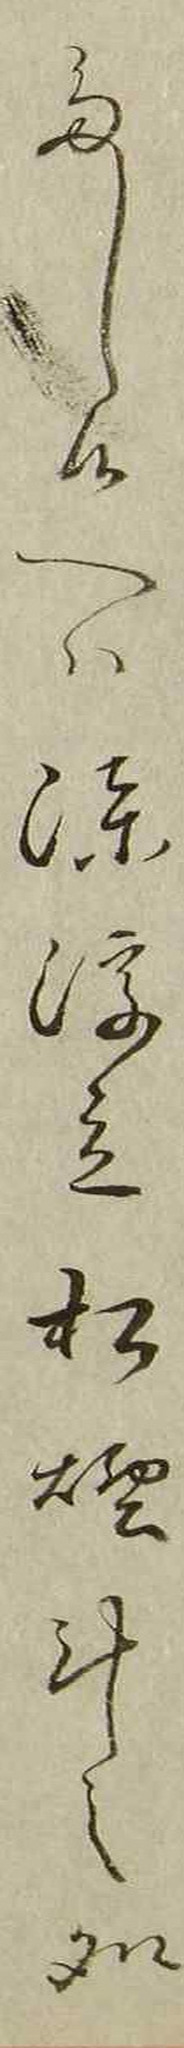たし候へハ漆浮立松煙計之処
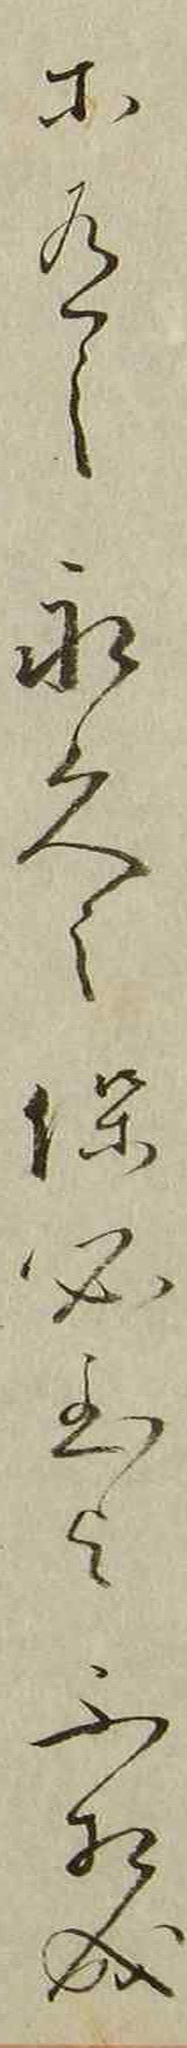等有之永久之保必至と不相成
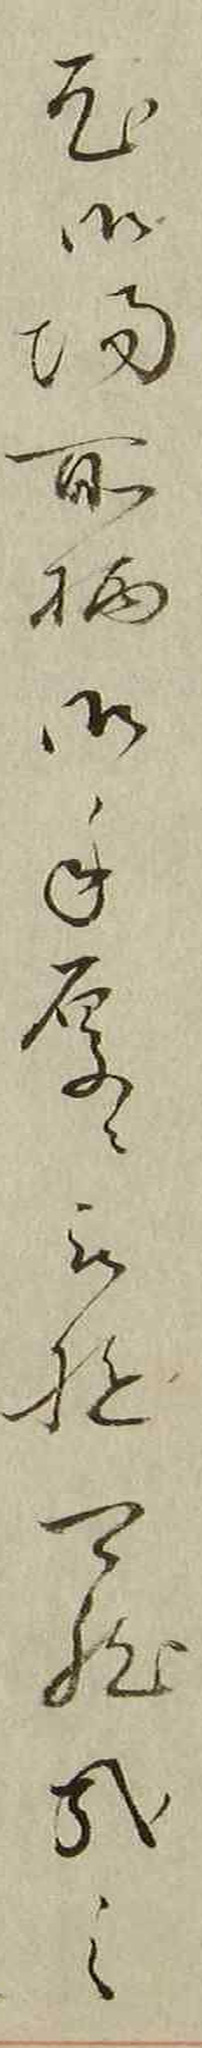尤御場所柄御手厚ニ被遊可然哉之
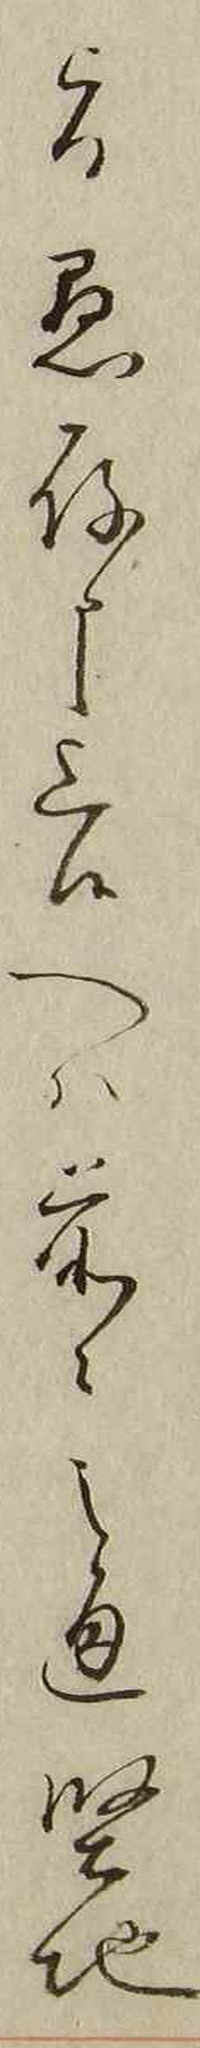旨懸存申上候へハ前々之通堅地
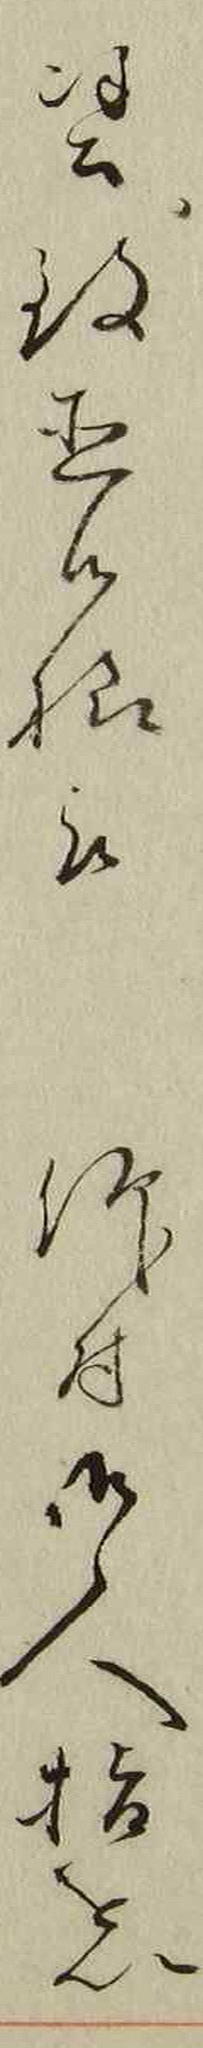壁致直候様被仰付候御人指を以
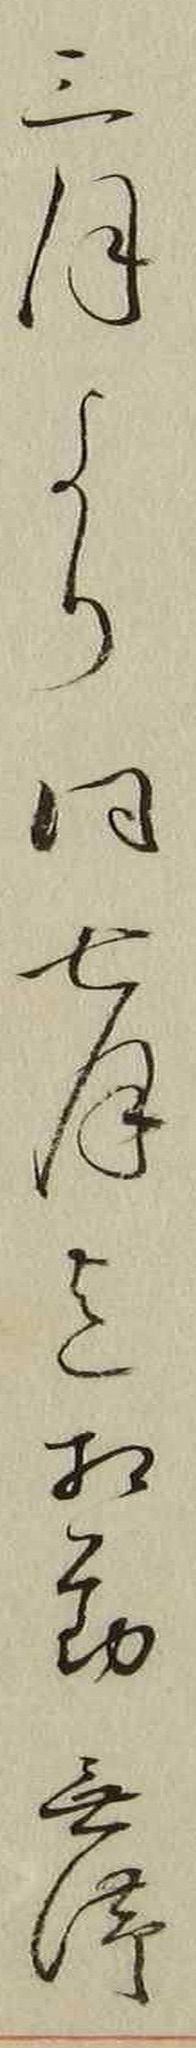三月より同七月迄相勤無滞
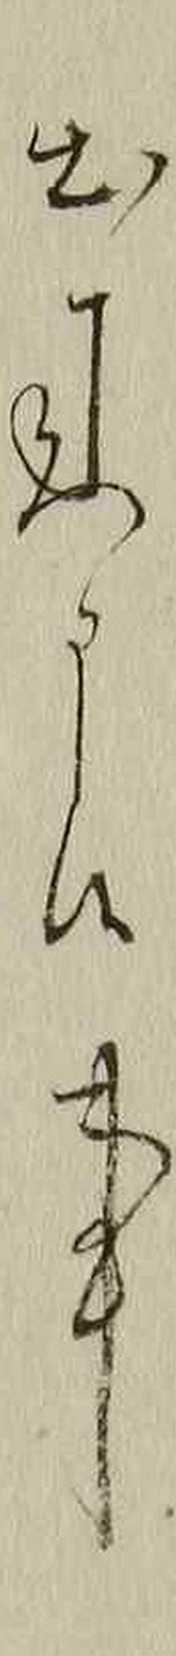出来申候事
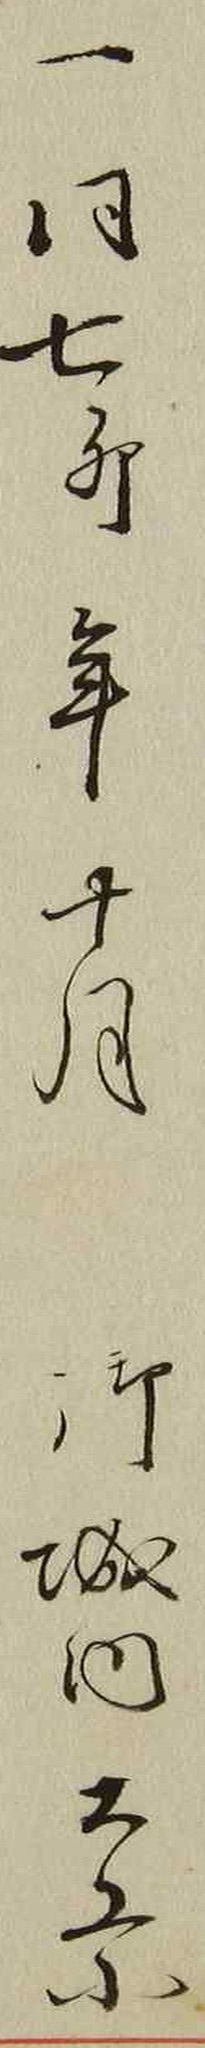一同七卯年十月御城内大工小
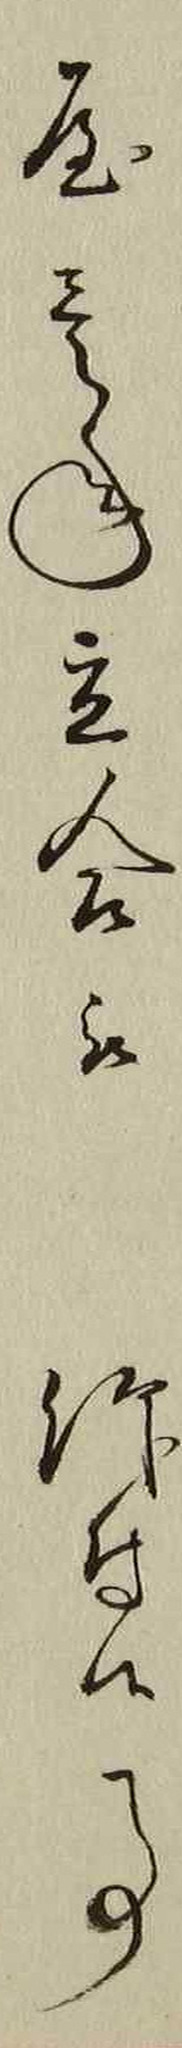屋壱年立合被仰付候事
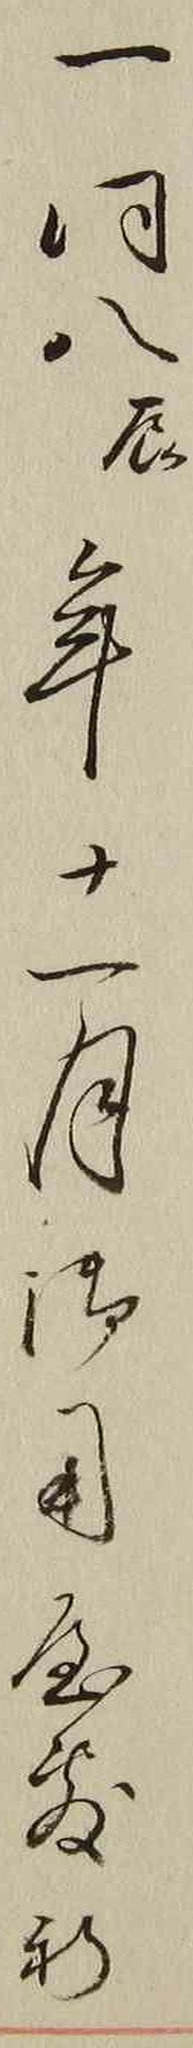一同八辰年十一月御用屋敷新
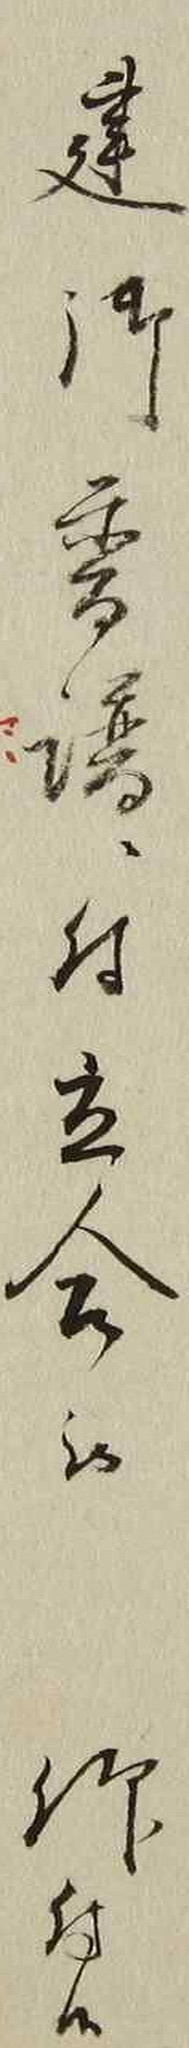建御普請ニ付立合被仰付候
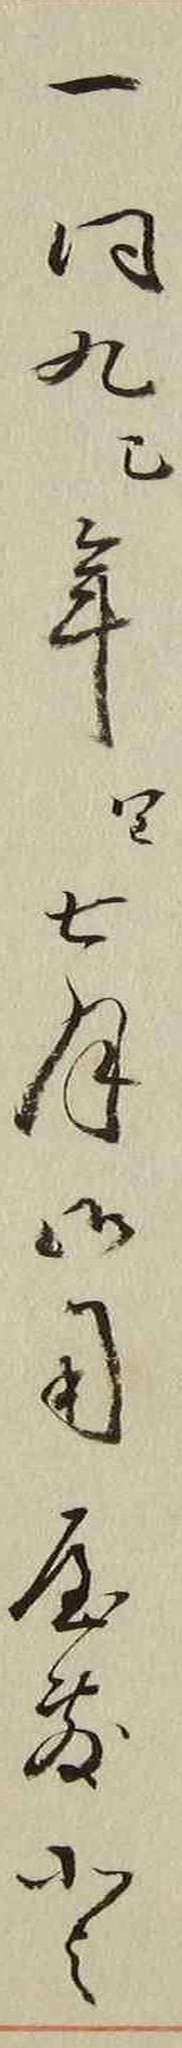一同九巳年閏七月御用屋敷北之
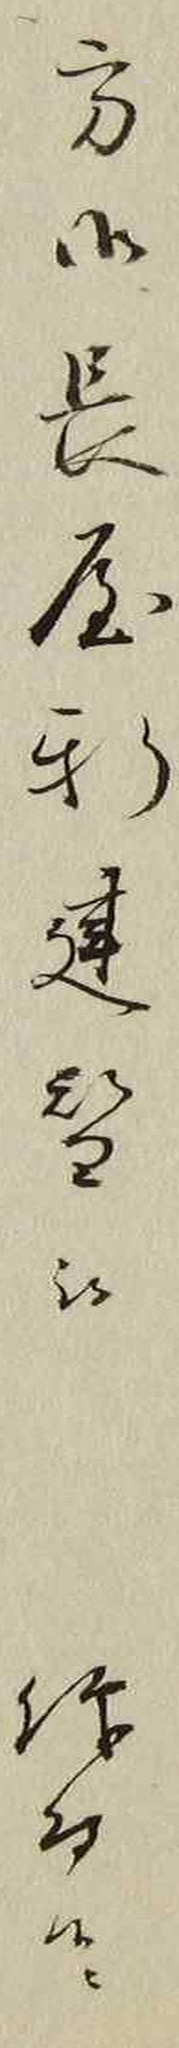方御長屋新建替被仰付候ニ
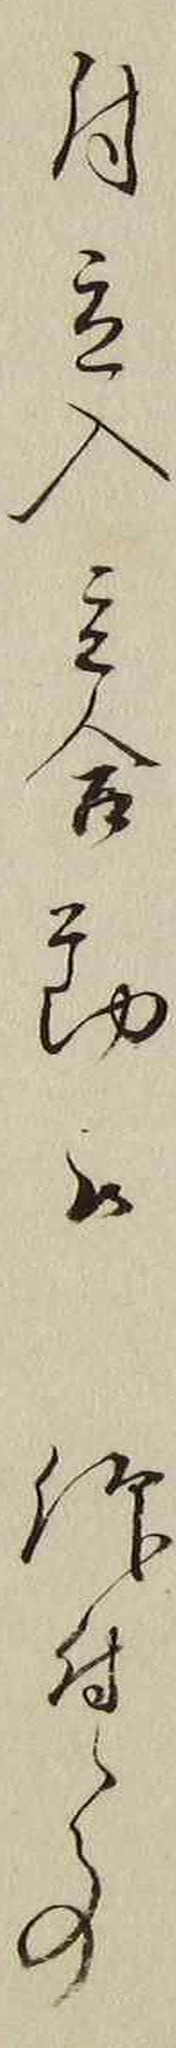付立入立合勤被仰付候事
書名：諸士系譜　巻之8　い之部8
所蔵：会津若松市立会津図書館
